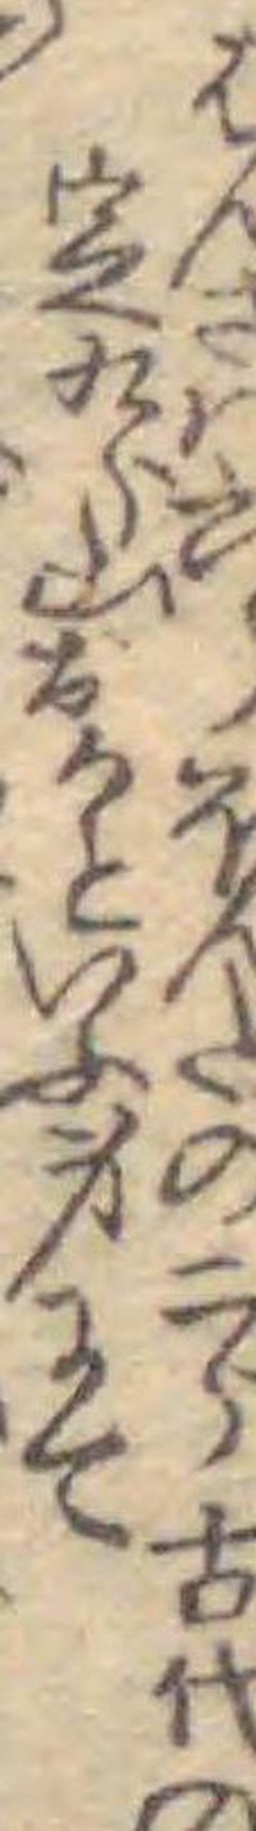定九郎山おかといふ身にて
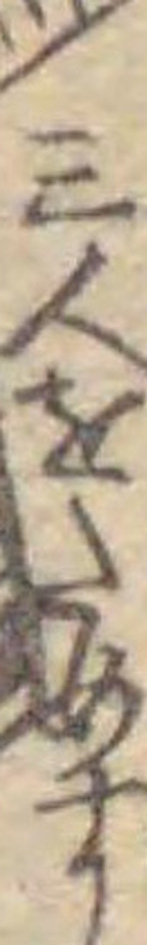三人をためす
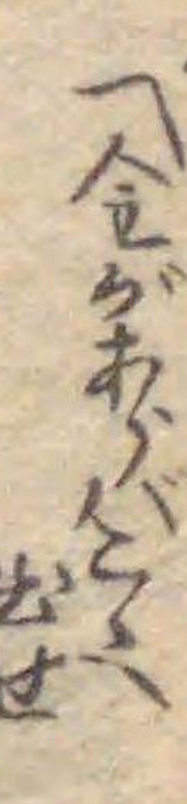〽金があらばこゝへ
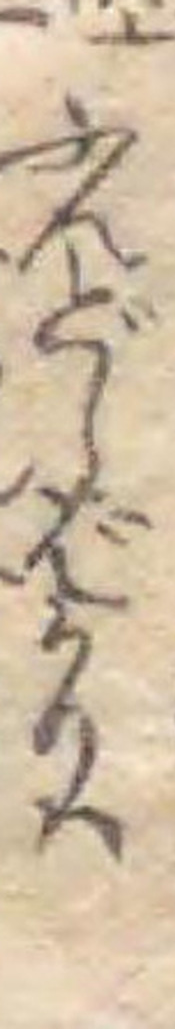ふんどしばかりは
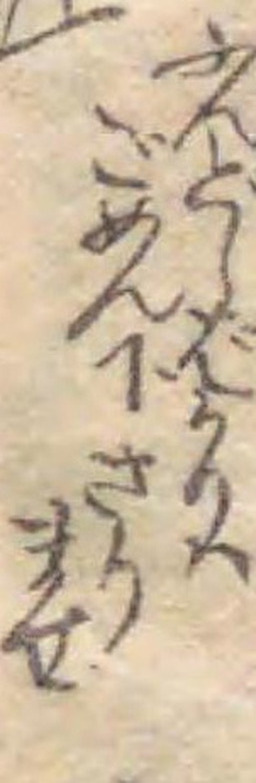ごめん下さり
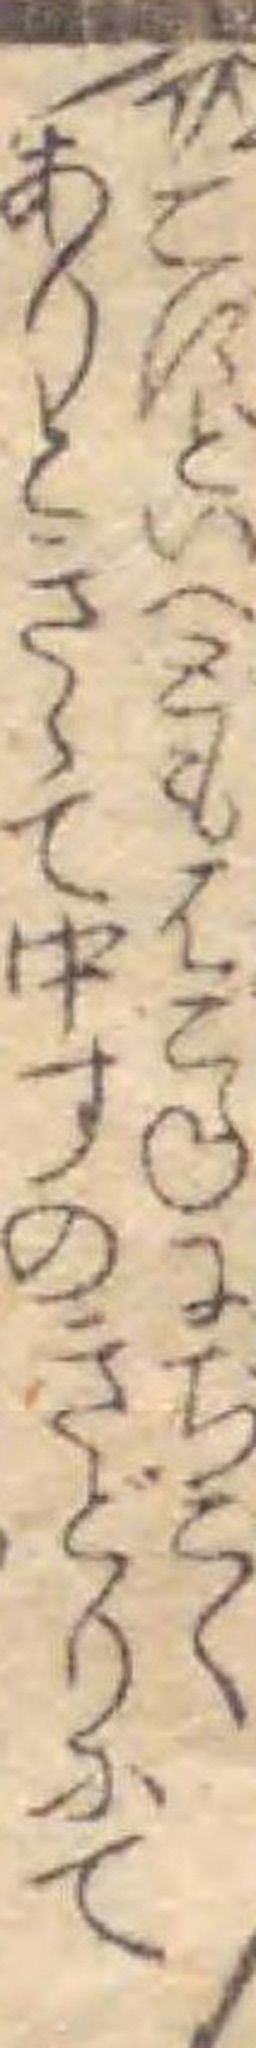ありときゝて中すのきどりにて
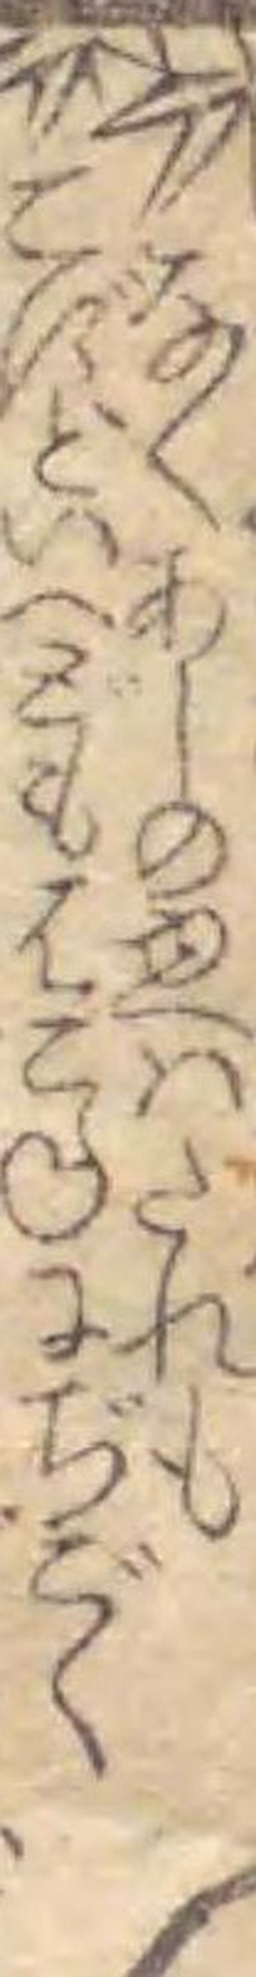こずといへどもはこねにぢごく
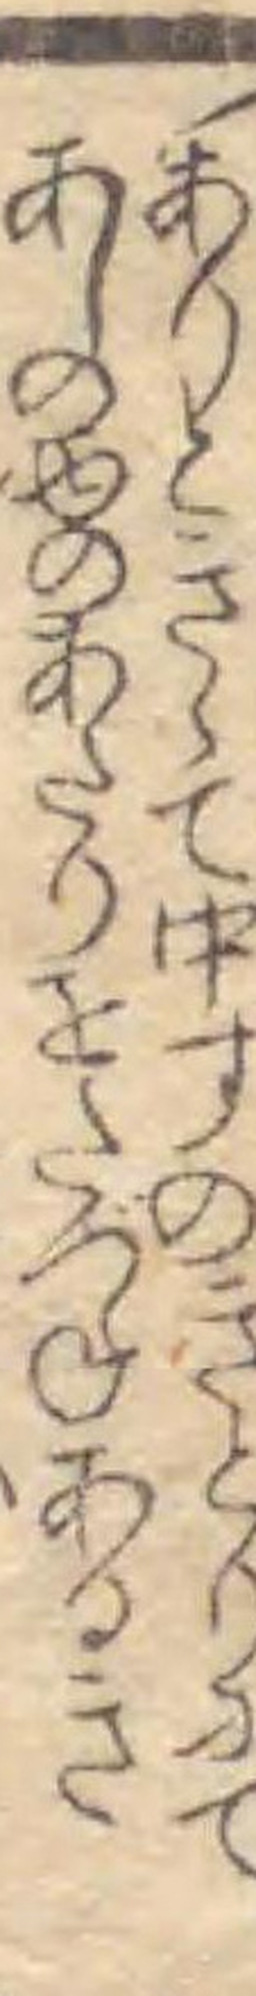あしのゆのあたりをたづねあるき
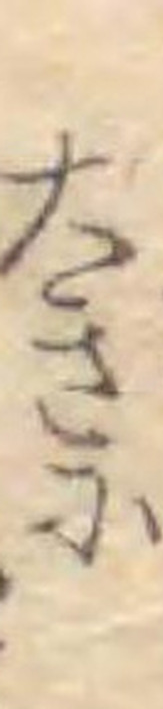大きに
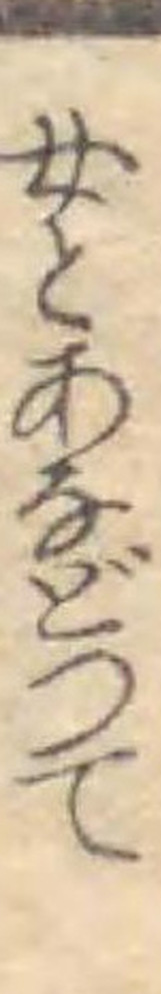女とあなどつて
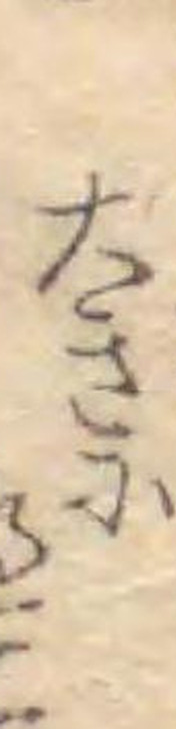大きに
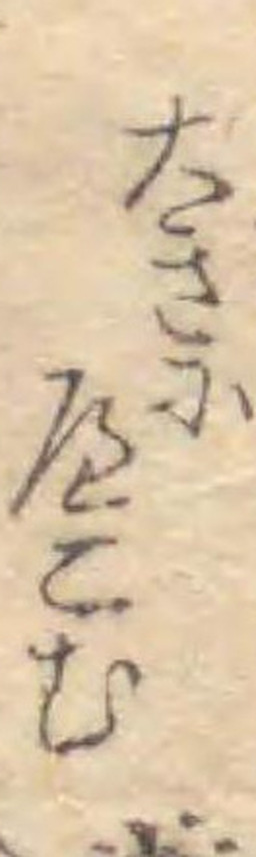へこむ
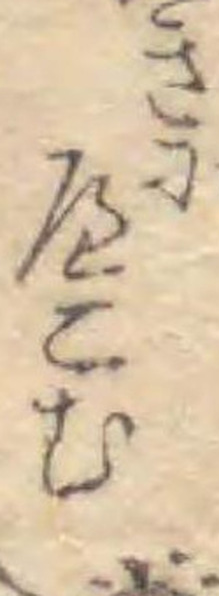へこむ
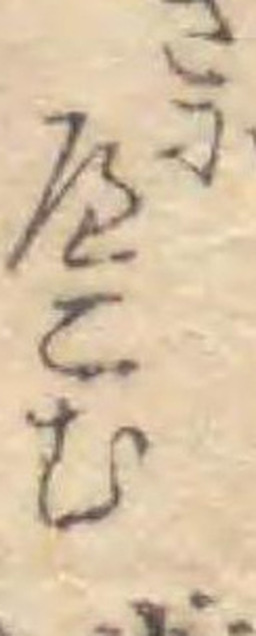へこむ
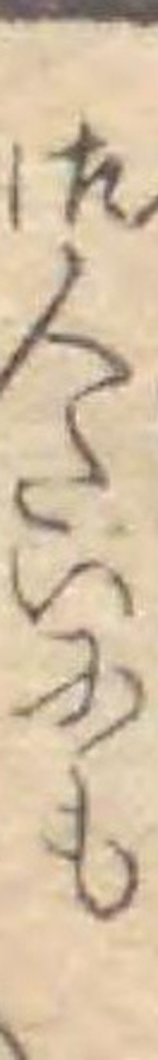御人たいにも
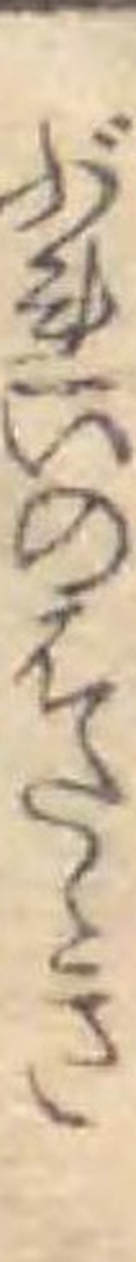ぶれいのはたらき
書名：文武二道万石通 : 3巻
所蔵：国立国会図書館 National Diet Library, JAPAN
